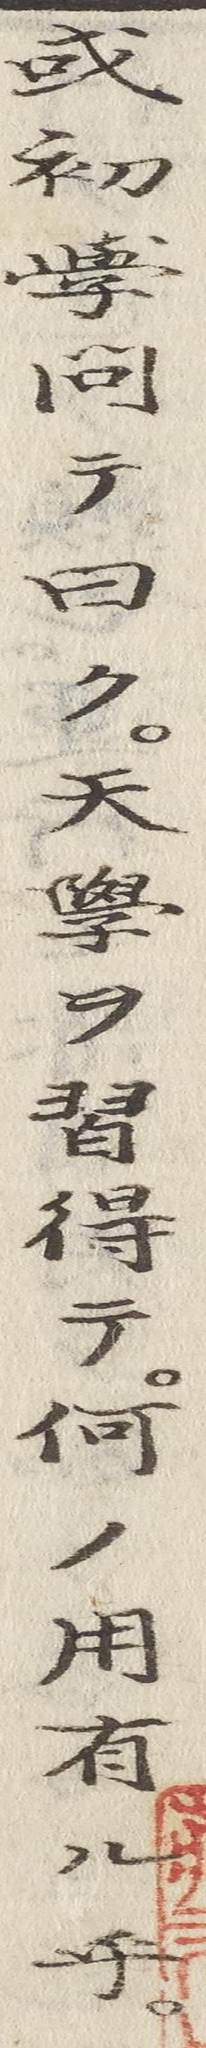或初学問テ曰ク。天学ヲ習得テ。何ノ用有ル乎。
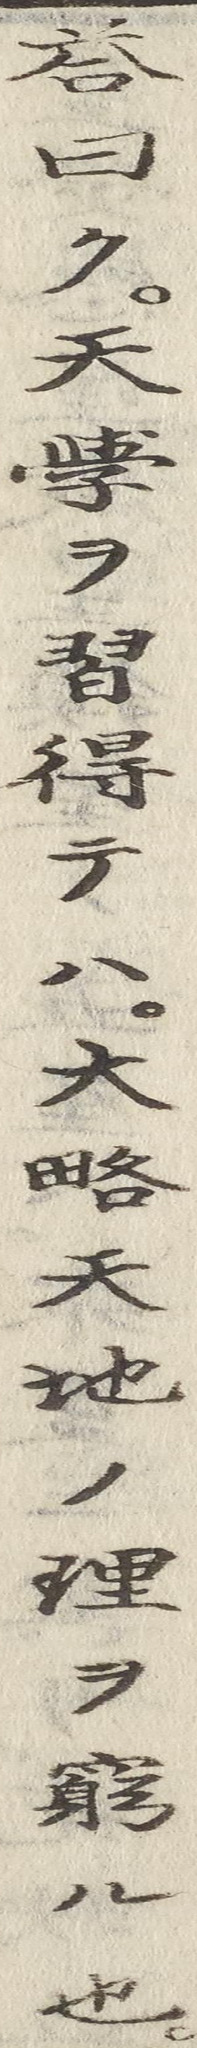答曰ク。天学ヲ習得テハ。大略天地ノ理ヲ窮ル也。
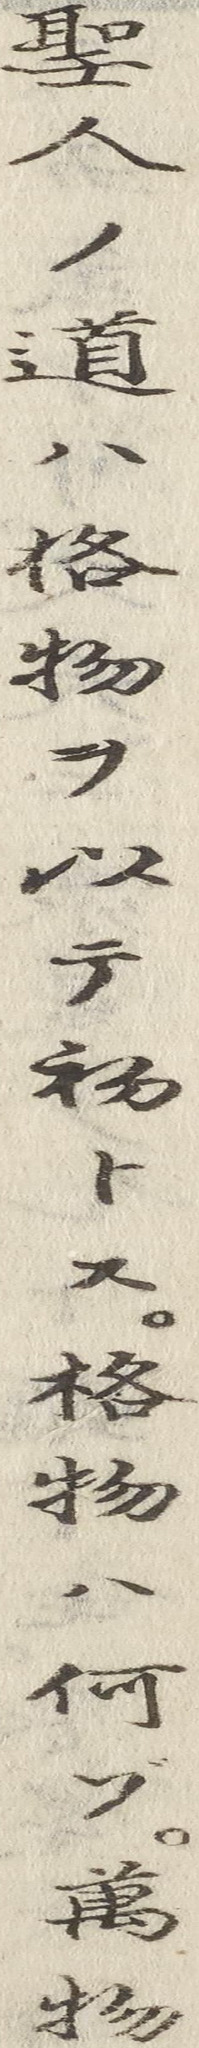聖人ノ道ハ格物ヲ以テ初トス。格物ハ何ゾ。万物
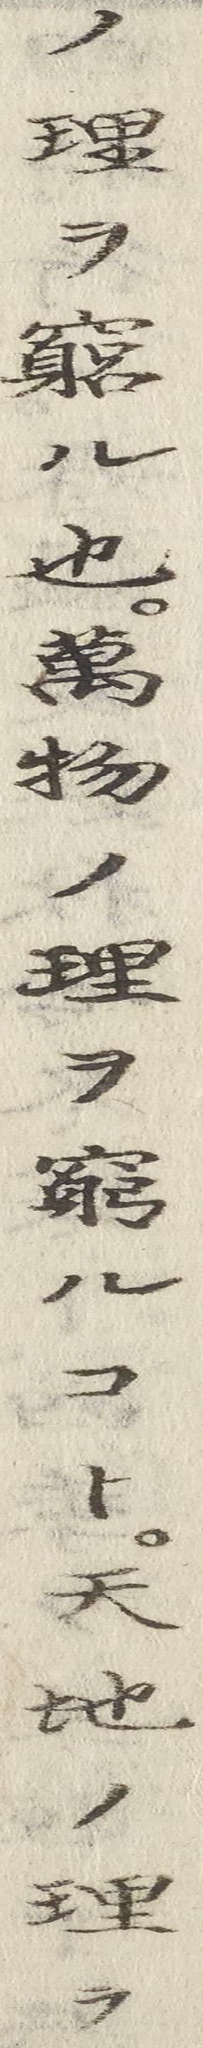ノ理ヲ窮ル也。万物ノ理ヲ窮ルコト。天地ノ理ヲ
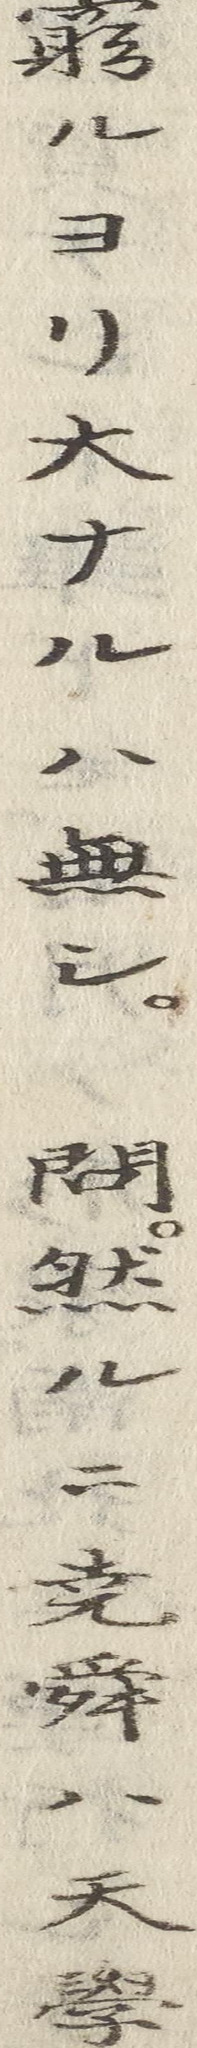窮ルヨリ大ナルハ無シ。問。然ルニ尭舜ハ天学
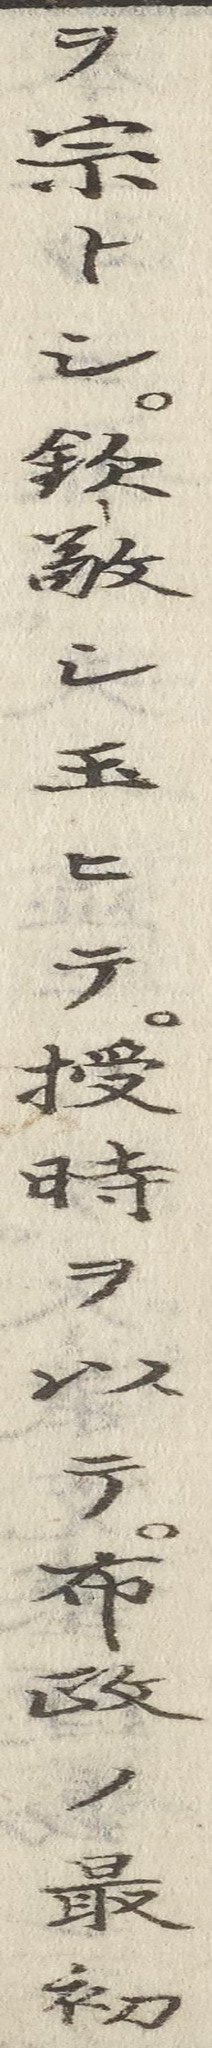ヲ宗トシ。欽敬シ玉ヒテ。授時ヲ以テ。布政ノ最初
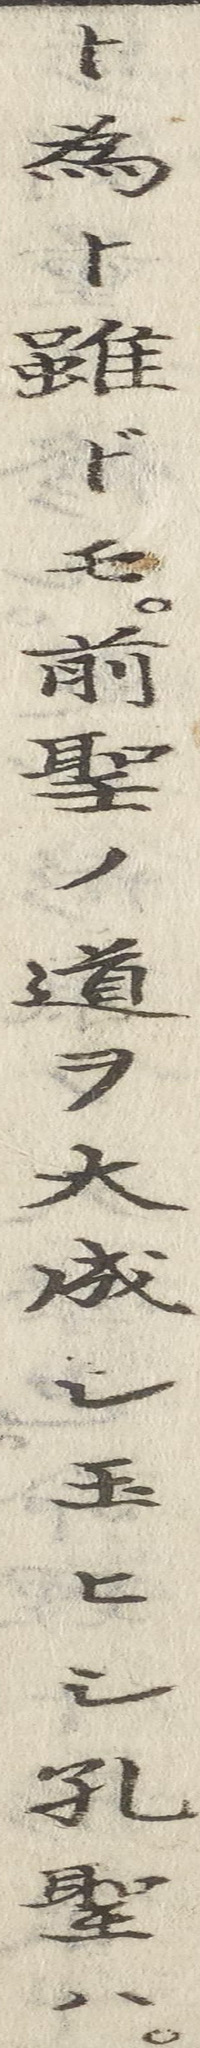ト為ト雖ドモ。前聖ノ道ヲ大成シ玉ヒシ孔聖ハ。
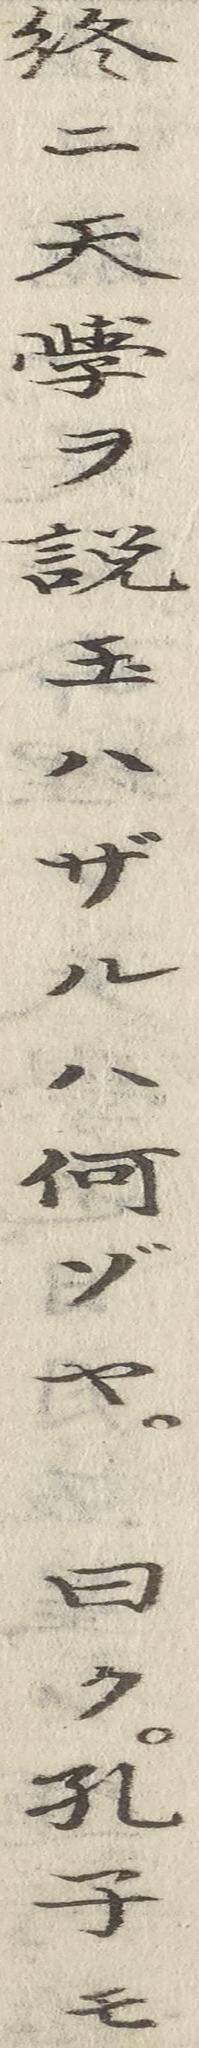終ニ天学ヲ説玉ハザルハ何ゾヤ。曰ク。孔子モ
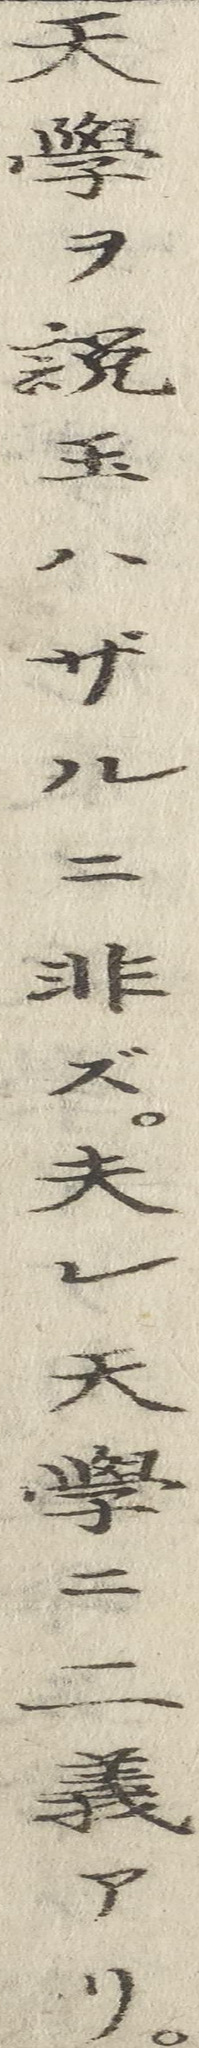天学ヲ説玉ハザルニ非ズ。夫レ大学ニ二義アリ。

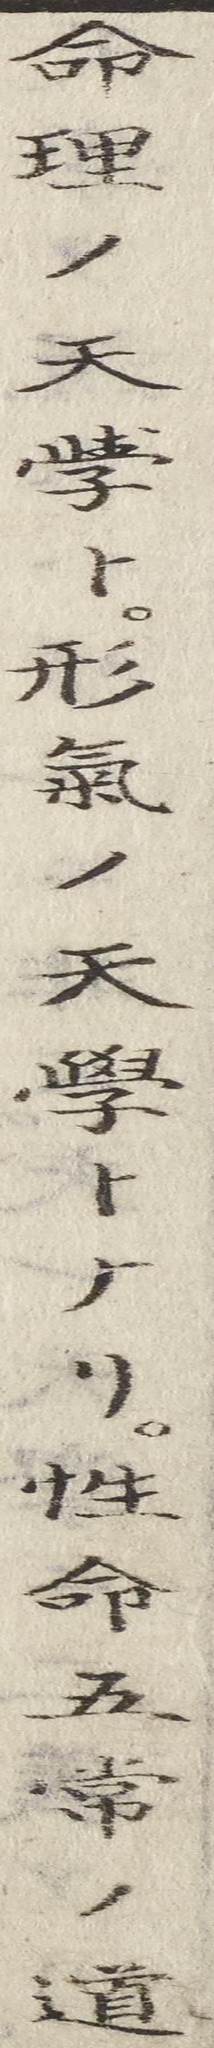命理ノ天学ト。形気ノ天学トナリ。性命五常ノ道
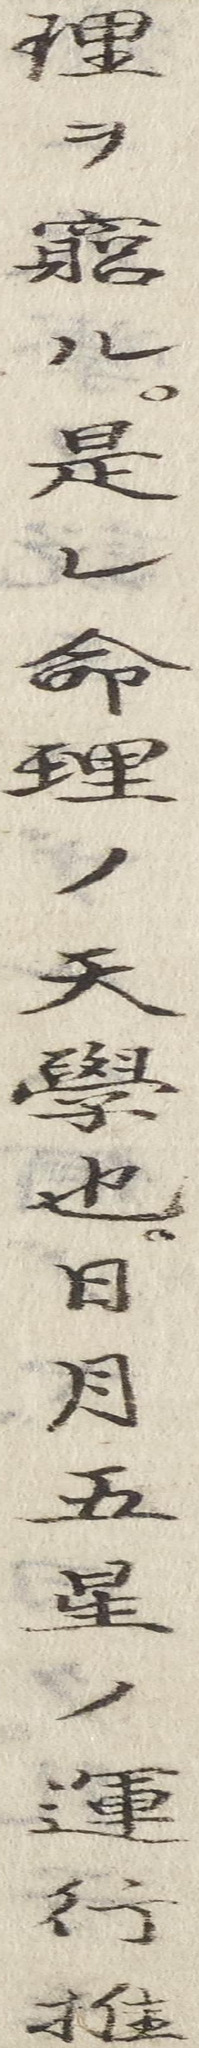理ヲ窮ル。是レ命理ノ天学也。日月五星ノ運行推
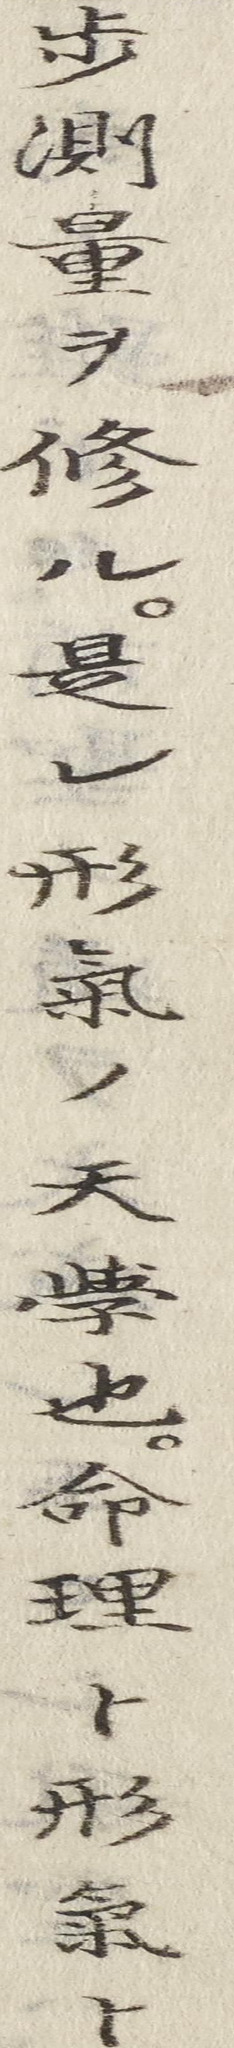歩測量ヲ修ル。是レ形気ノ天学也。命理ト形気ト
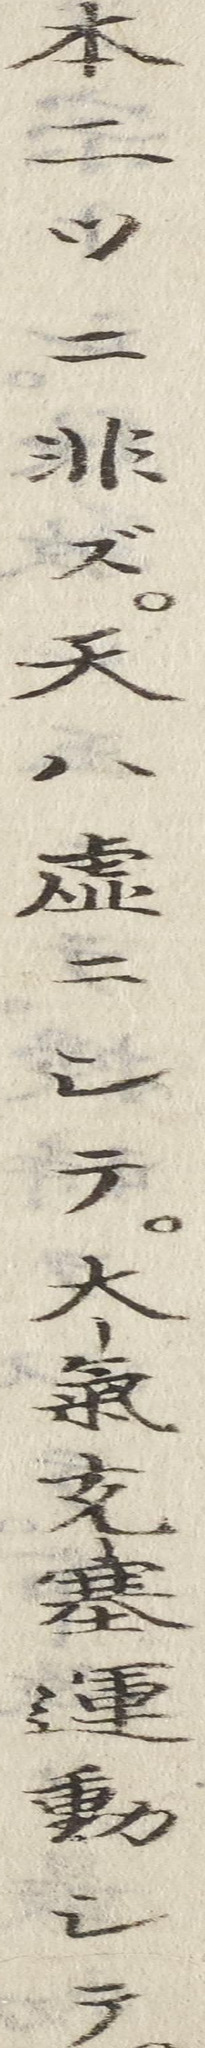本二ツニ非ズ。天ハ虚ニシテ。大-気充塞運動シテ。
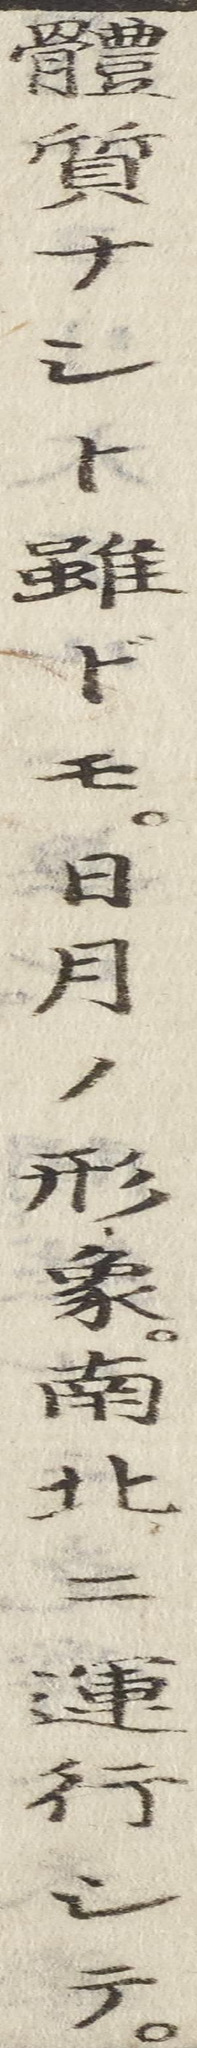体質ナシト雖ドモ。日月ノ形-象。南北ニ運行シテ。
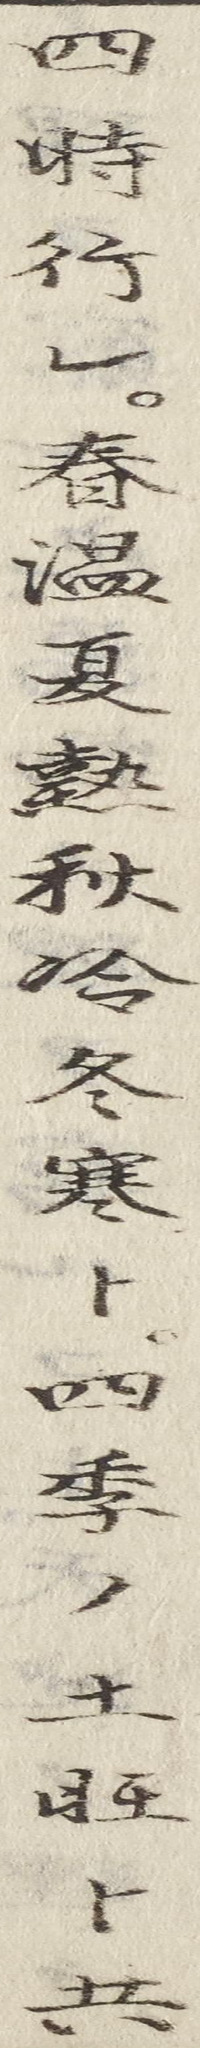四時行レ。春温夏熱秋冷冬寒ト。四季ノ土旺ト共
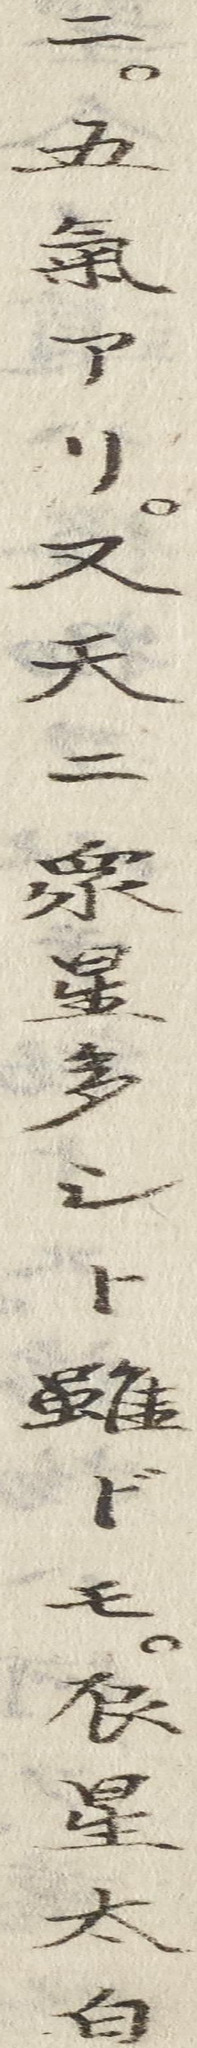ニ。五気アリ。又天ニ衆星多シト雖ドモ。辰星太白
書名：大略天学名目鈔　天經或問附録
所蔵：東京大学地震研究所図書室 Earthquake Research Institute Library, The University of Tokyo, JAPAN
